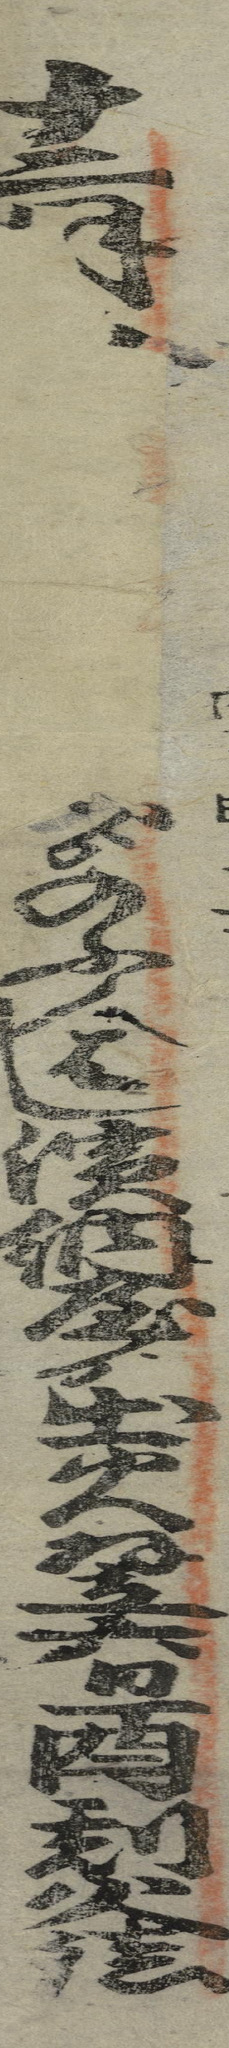十二月ゟのふ人はし僓納屋ゟ出火翌六日酉刻火鎮
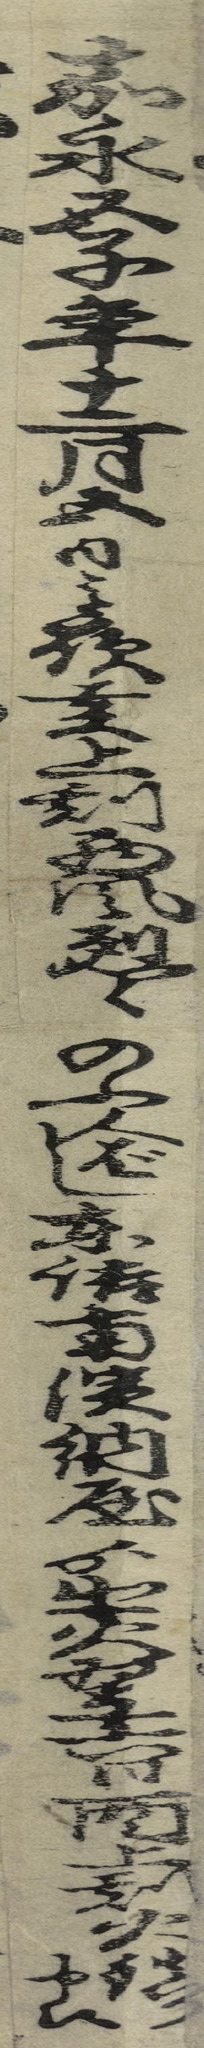嘉永五子年十二月五日之夜亥上刻西風烈くのふ人ばし東詰僓納屋ゟ出火翌六日酉上刻火鎮り申候
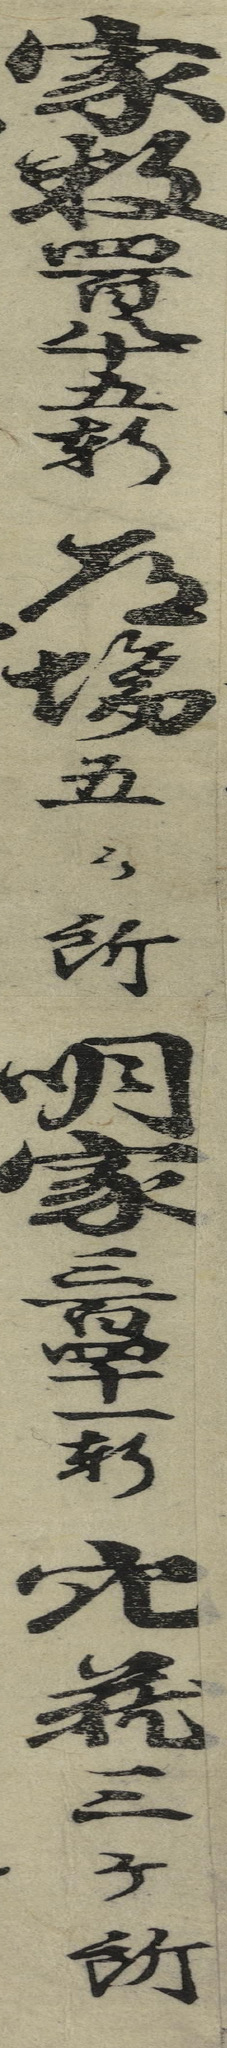家数四百八十五軒道場五ケ所明家三百四十一軒穴蔵三ケ所
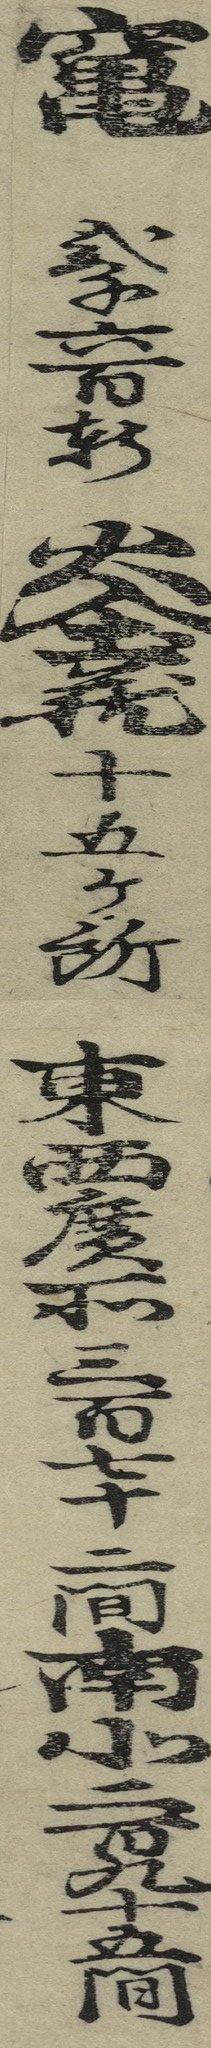竈弐千六百軒火入土蔵十五ケ所東西廣所三百七十二間南北二百九十五間
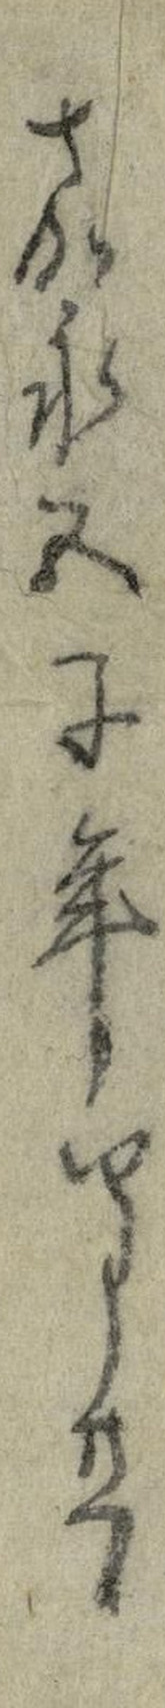嘉永五子年ノ四月廿日
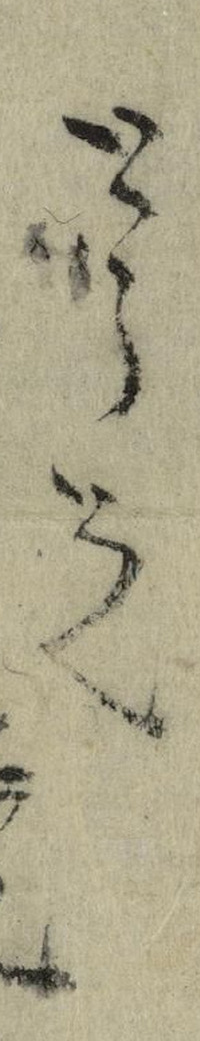とうとん
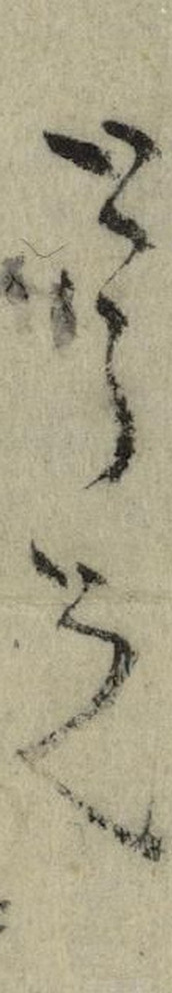とうとん
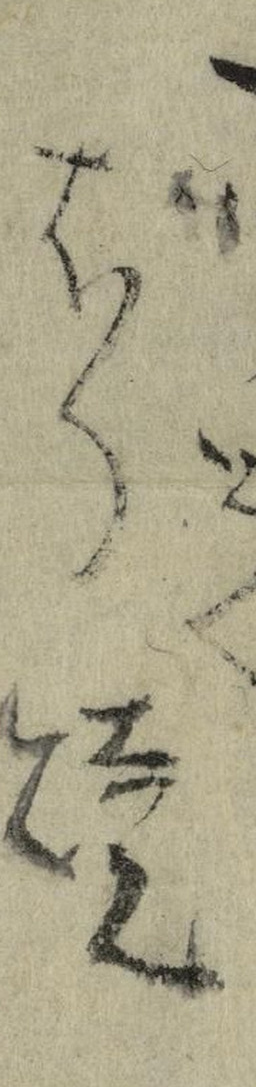ほり焼
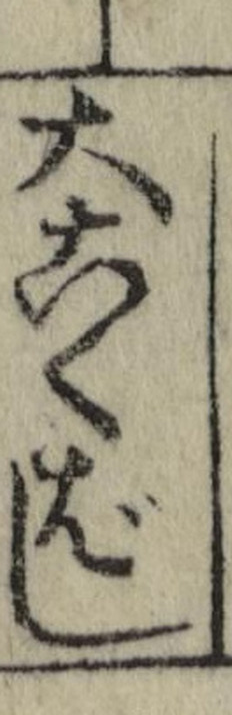大こくばし
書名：大阪上町出火略圖
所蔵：東京大学地震研究所図書室 Earthquake Research Institute Library, The University of Tokyo, JAPAN
